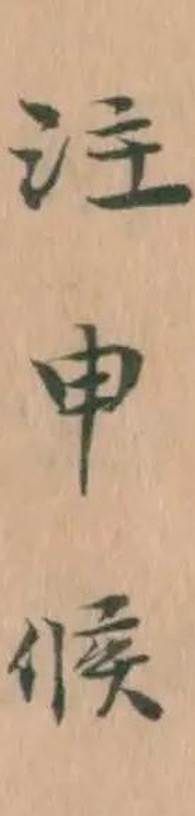注申候
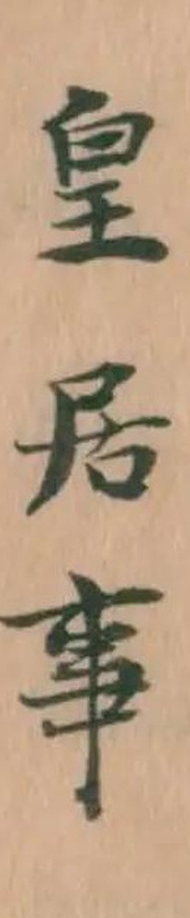皇居事
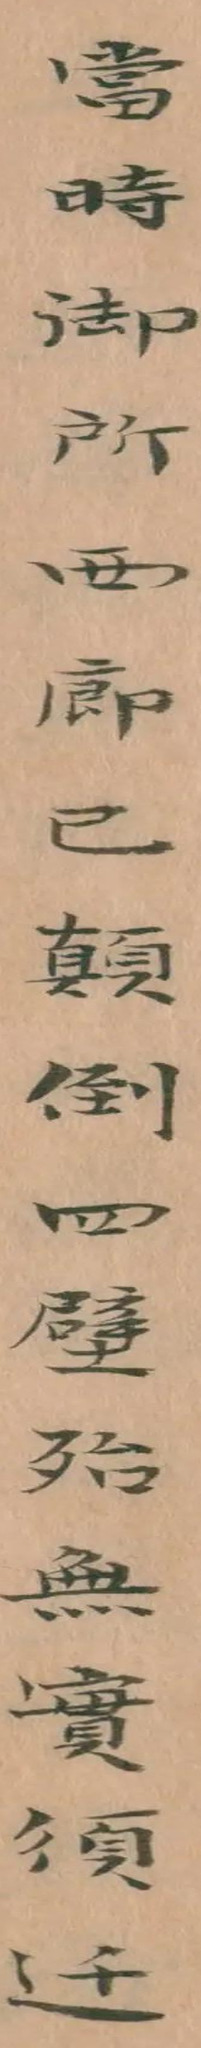当時御所西廊已顛倒四壁殆無実須遷
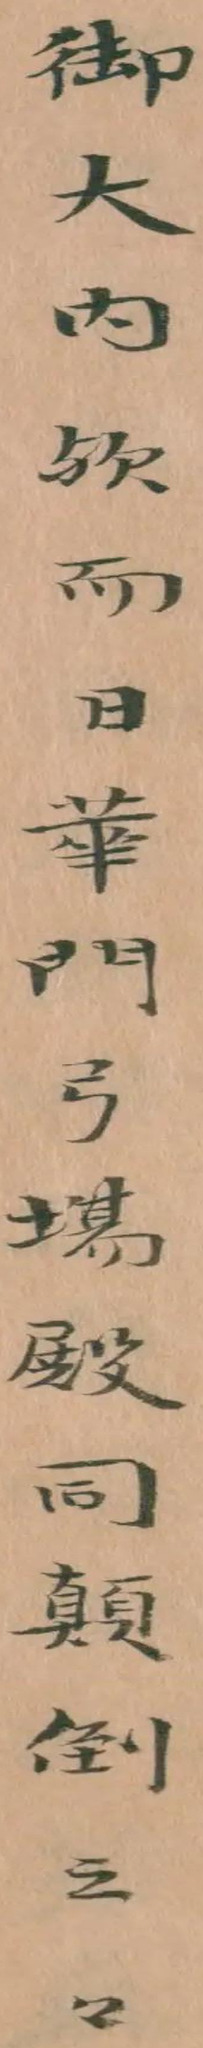御大内歟而日華門弓場殿同顛倒云々
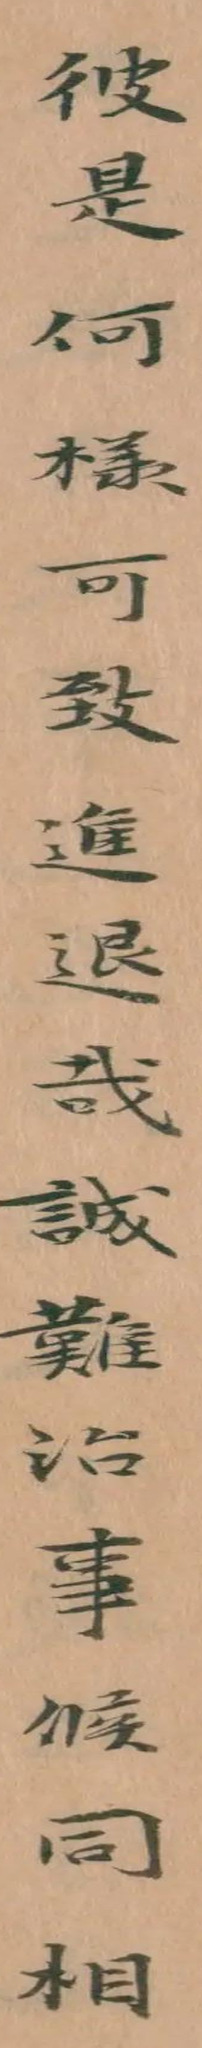彼是何様可致進退哉誠難治事候同相
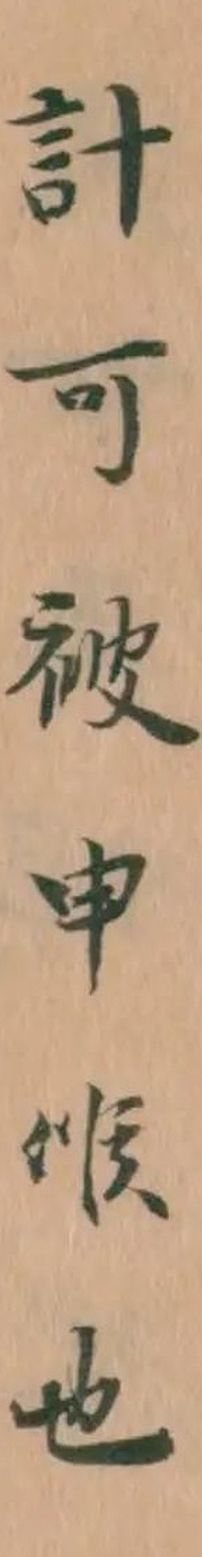計可被申候也
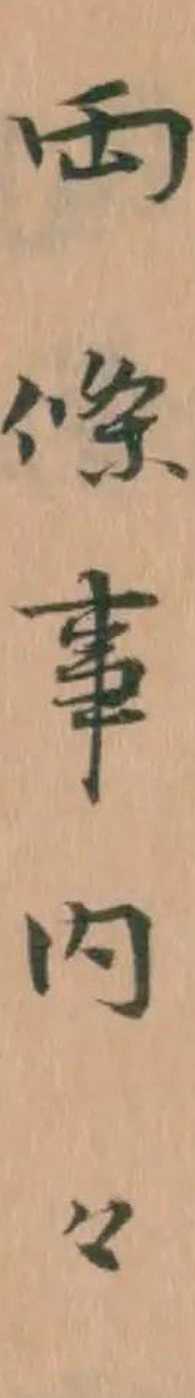両条事内々
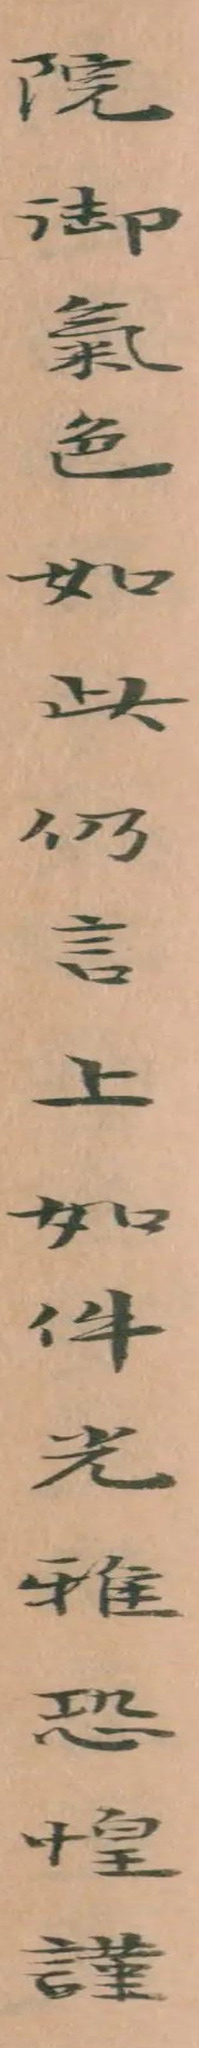院御気色如此仍言上如件光雅恐惶謹
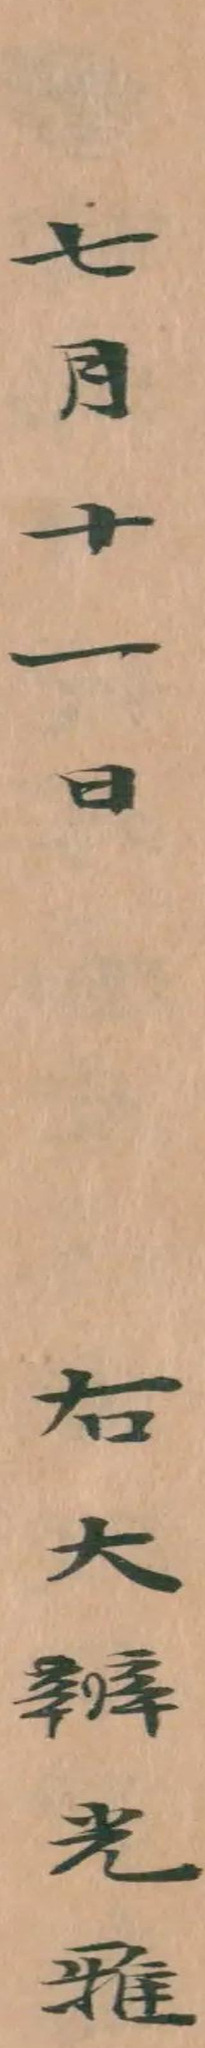七月十一日右大弁光雅
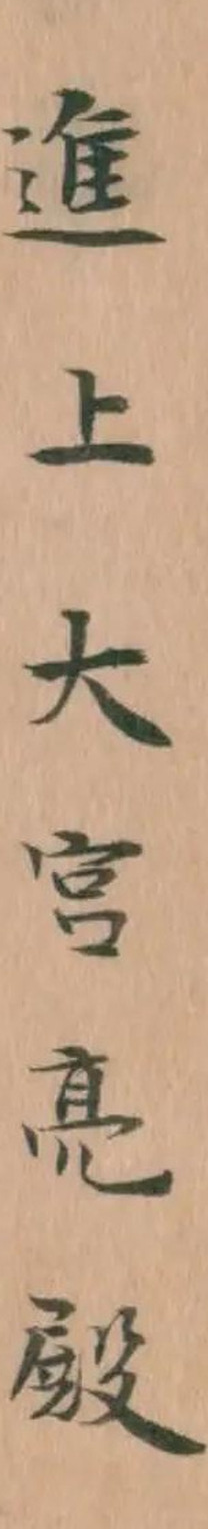進上大宮亮殿
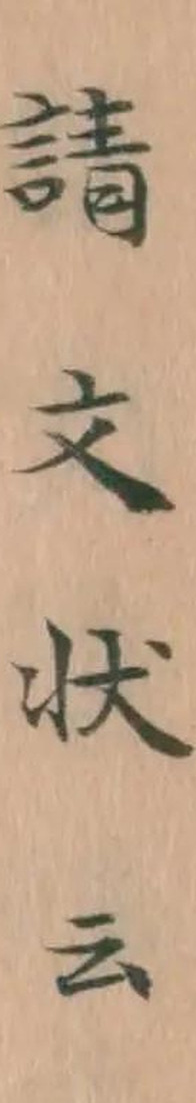請文状云
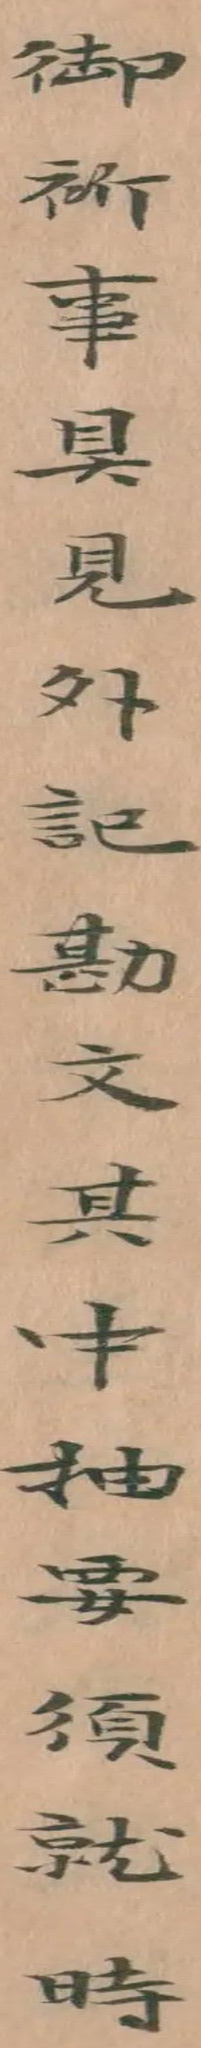御祈事具見外記勘文其中抽要須就時
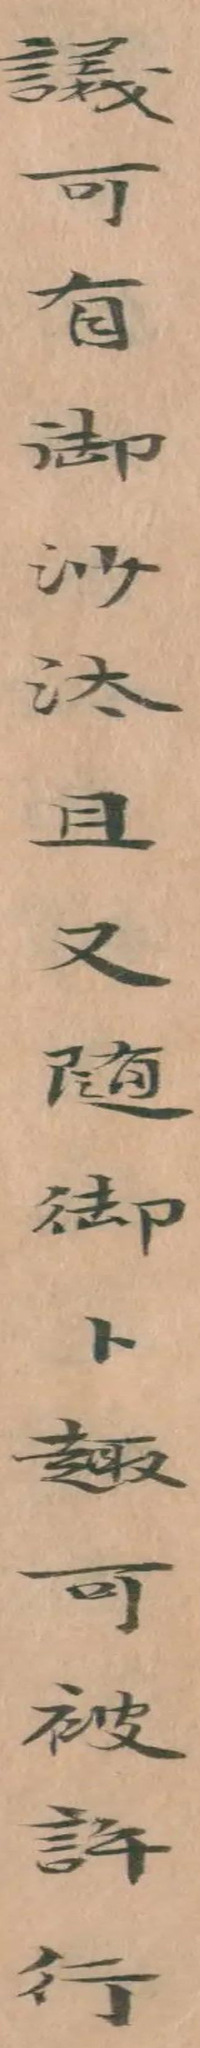議可有御沙汰且又随御卜趣可被許行
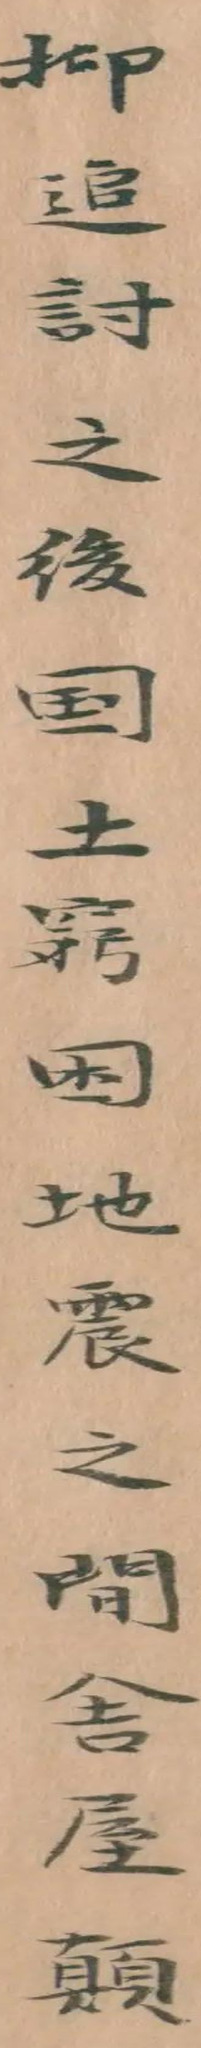抑追討之後国土窮困地震之間舎屋顛

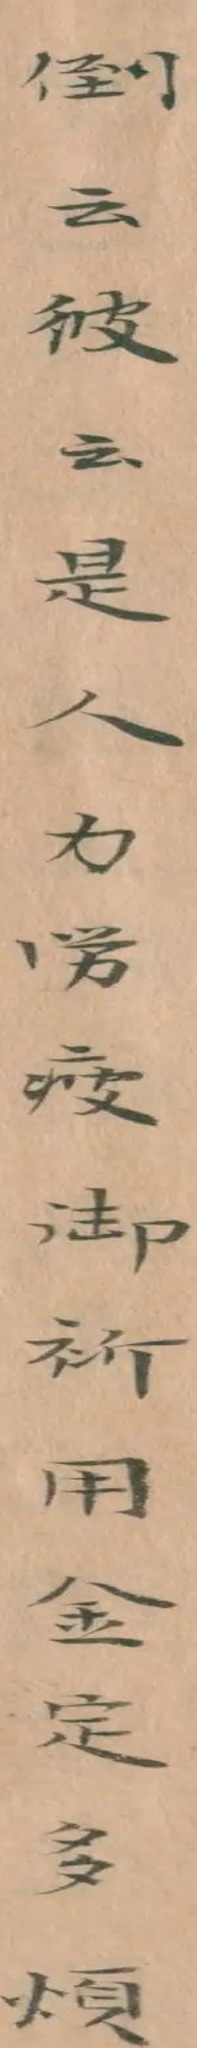倒云彼云是人力労疲御祈用金定多煩
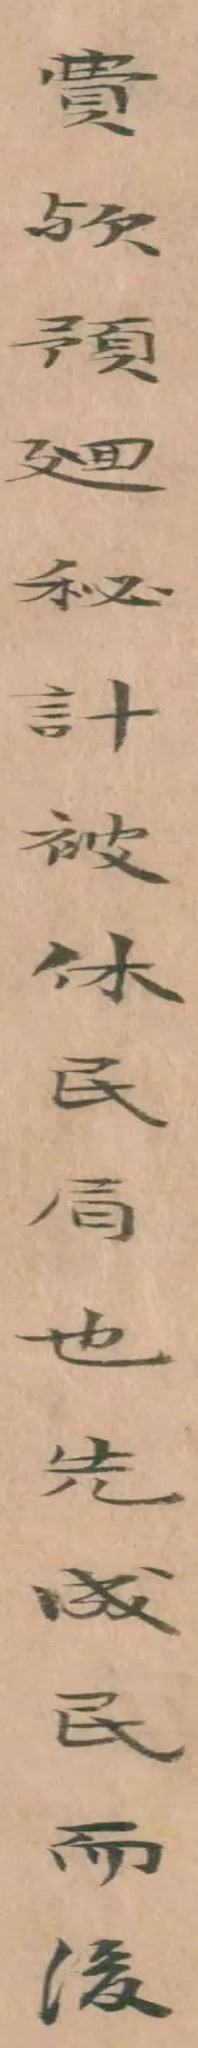費歟預廻秘計被休民局也先成民而後
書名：地災撮要. 巻5-6(地震之部)
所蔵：国立国会図書館 National Diet Library, JAPAN
